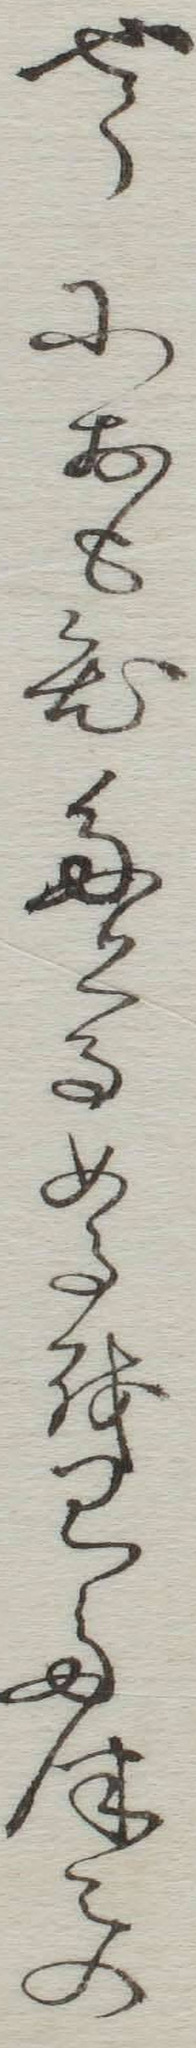やうにおもひたとるめるをわたつみの
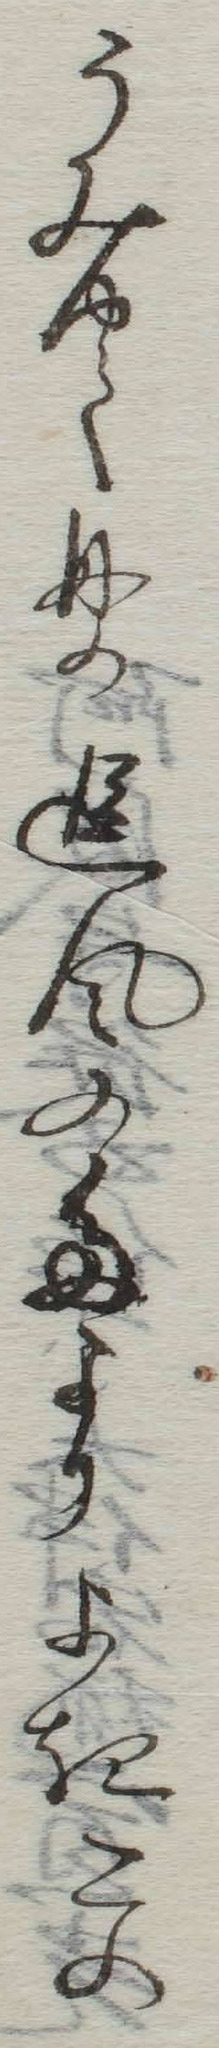うみゆく舟の追風のたよりよきこの
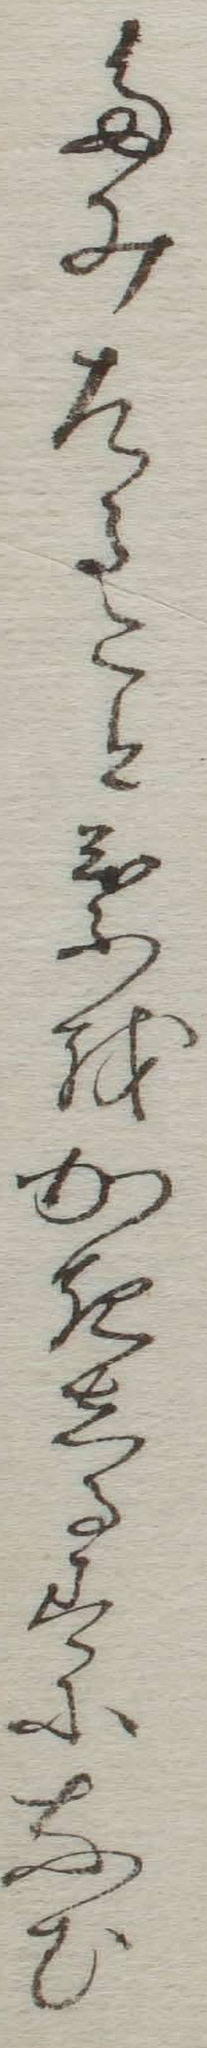たみたること葉をかきしるすになむ

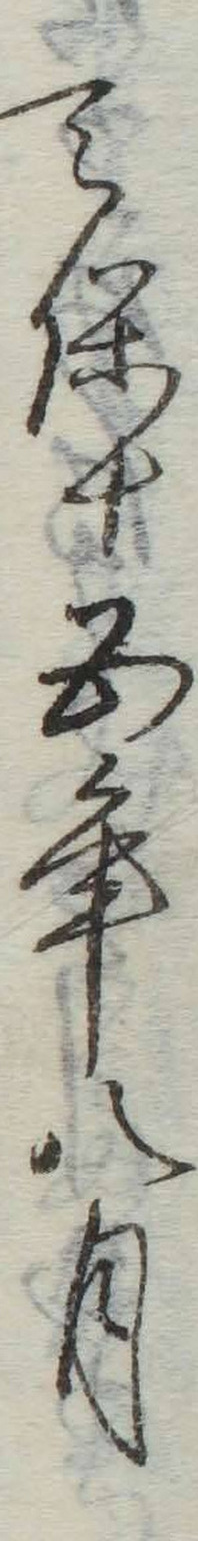天保十五年八月
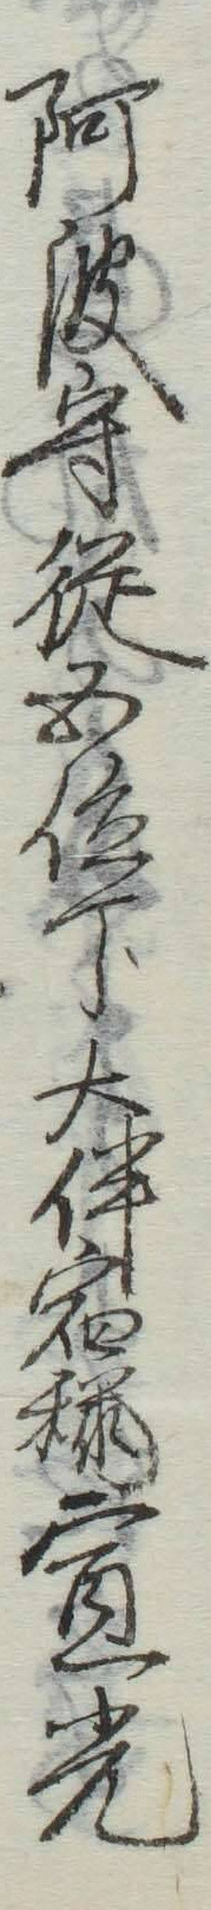阿波守従五位下大伴宿禰宣光
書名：三河国古跡考
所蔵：国文学研究資料館
